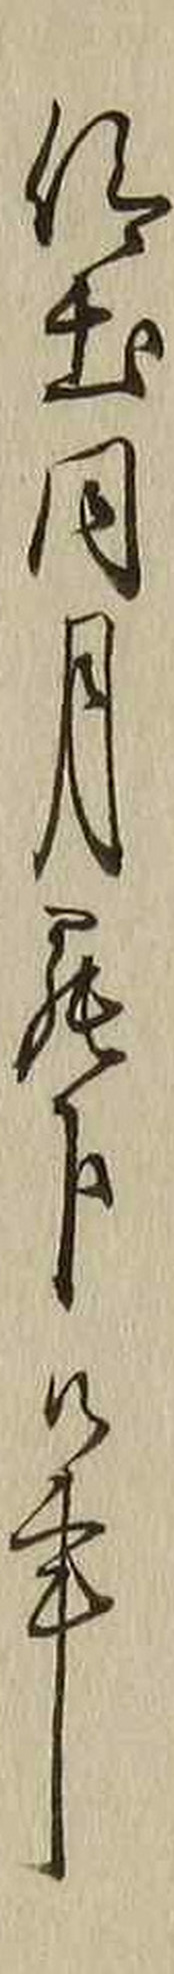仰出同月罷下候事
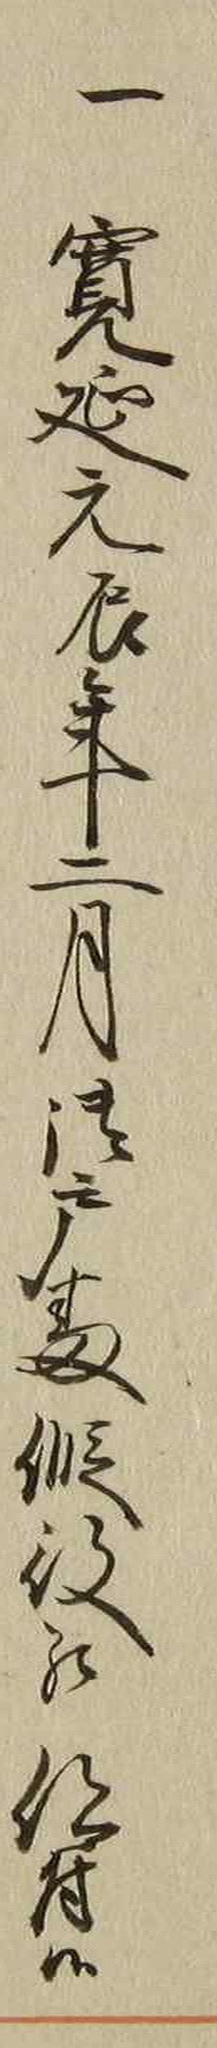一寛延元辰年二月御戸番仮役被仰付候
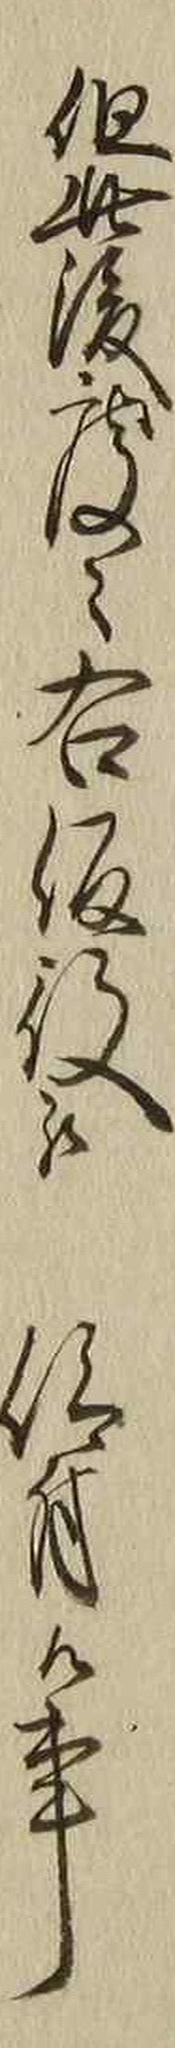但此後度々右仮役被仰付候事
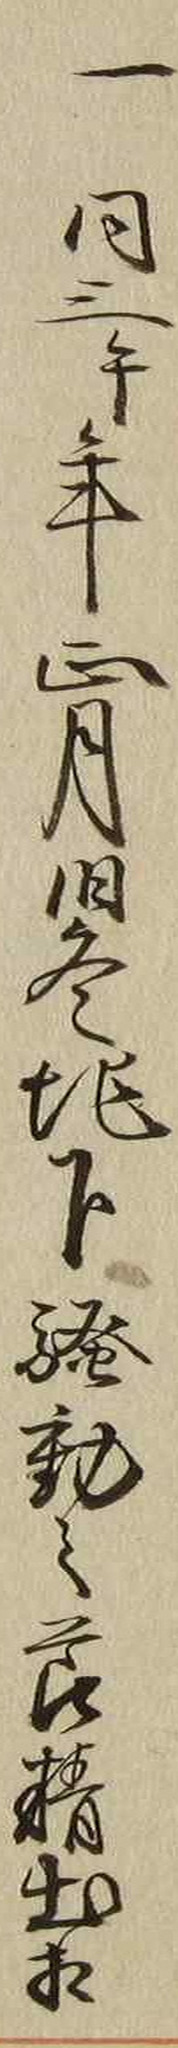一同三午年正月旧冬地下騒動之節精出相
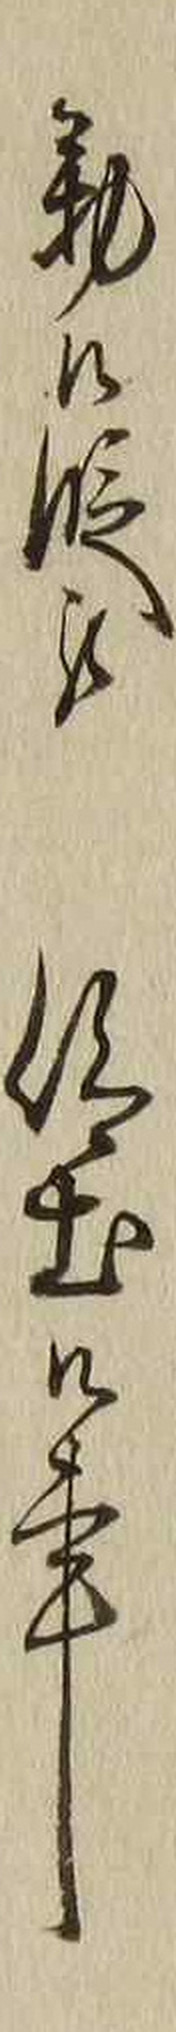勤候段被仰出候事
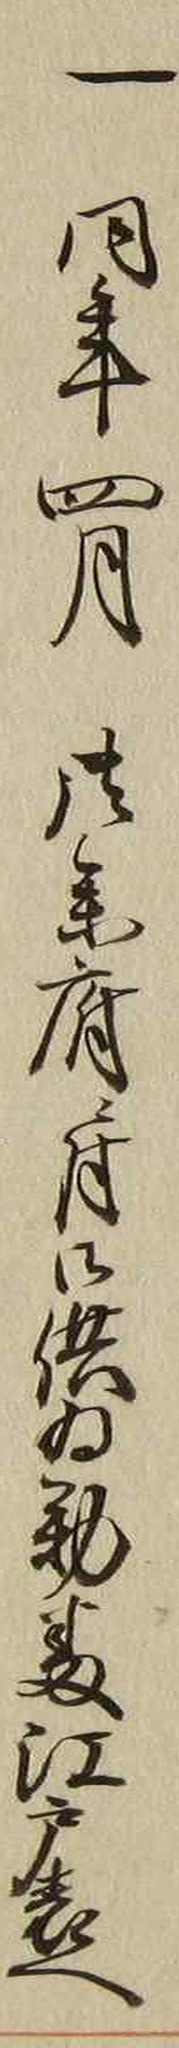一同年四月御参府に付御供為勤番江表表へ
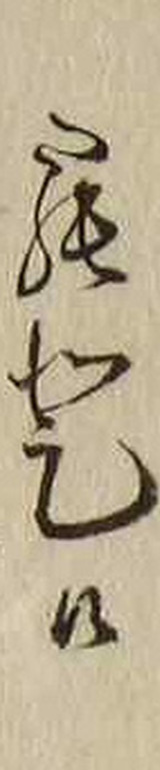罷登候
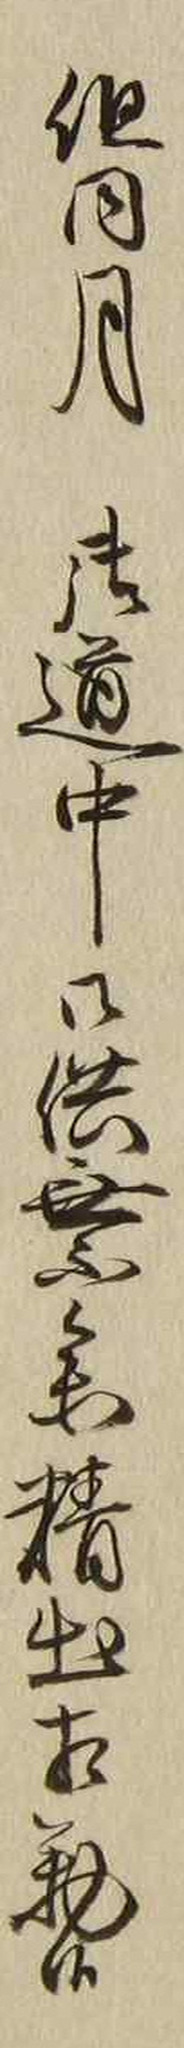但同月御道中御供無不参精出相勤候
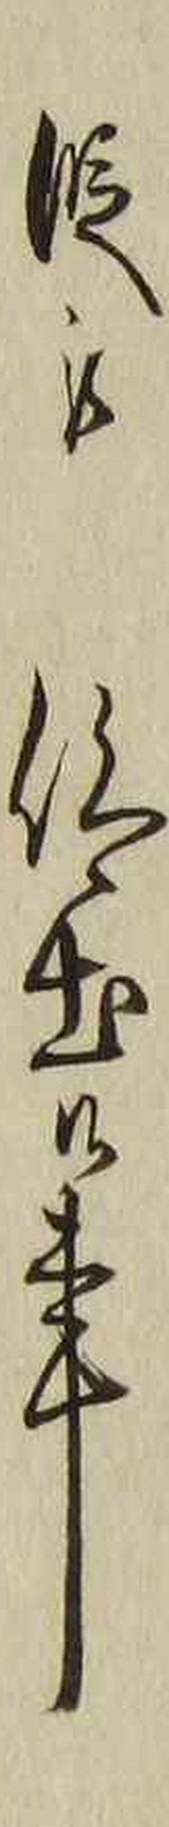段被仰出候事
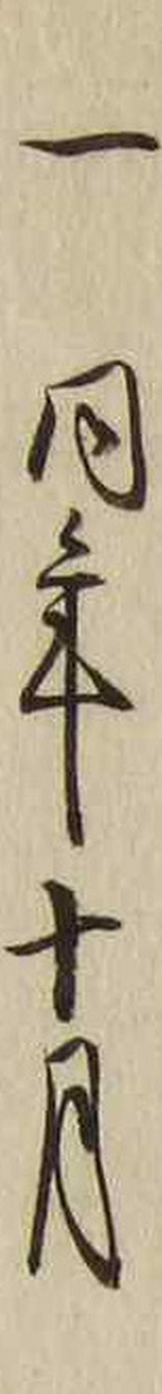一同年十月

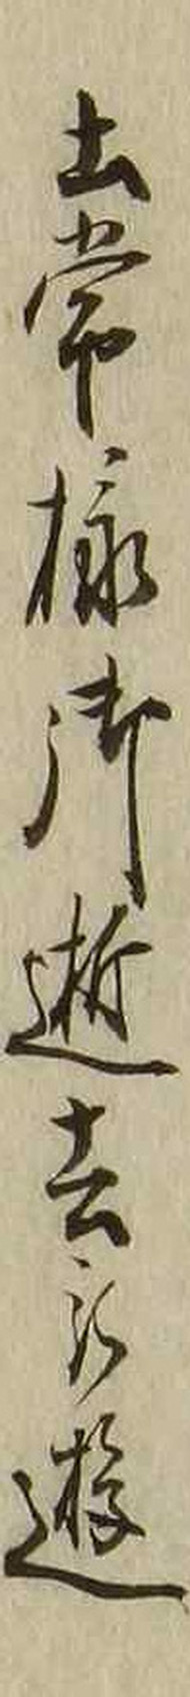土常様御逝去被遊
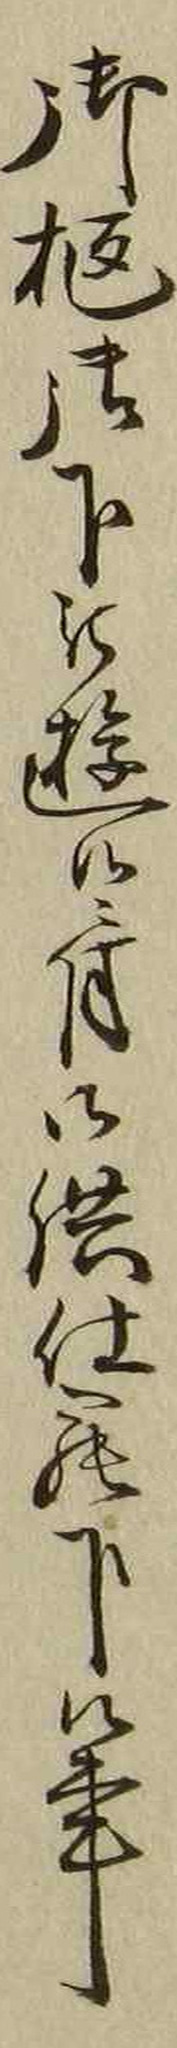御柩御下被遊候に付御供仕罷下候事
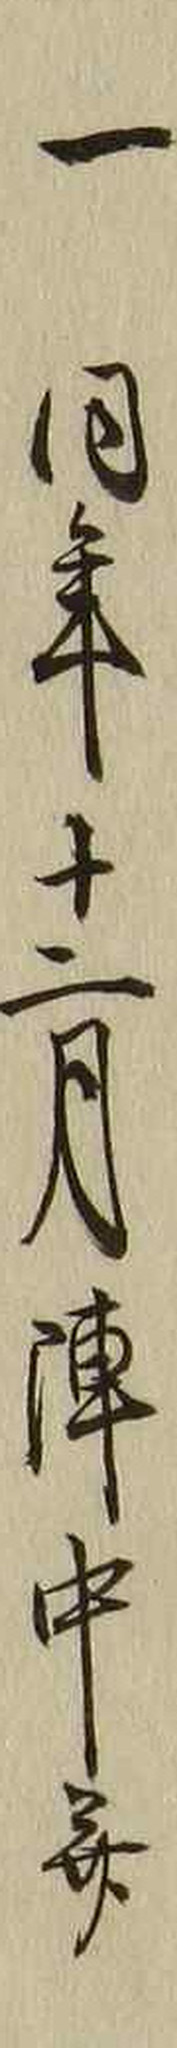一同年十二月陣中并
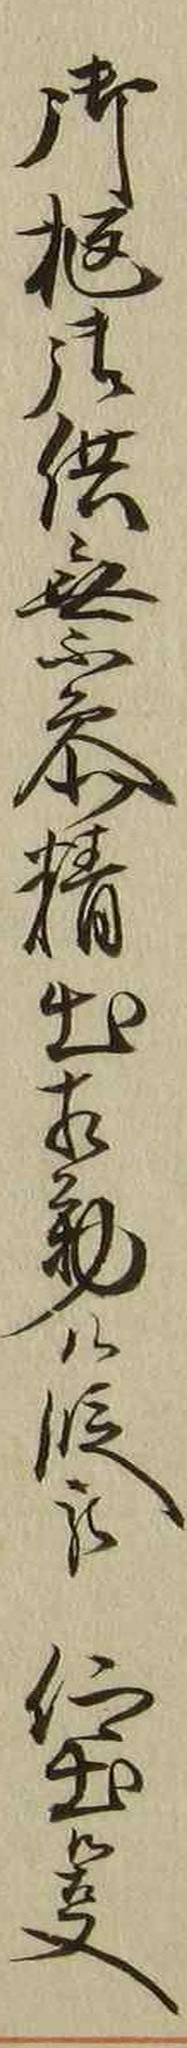御柩御供無不参精出相勤候段被仰出候事
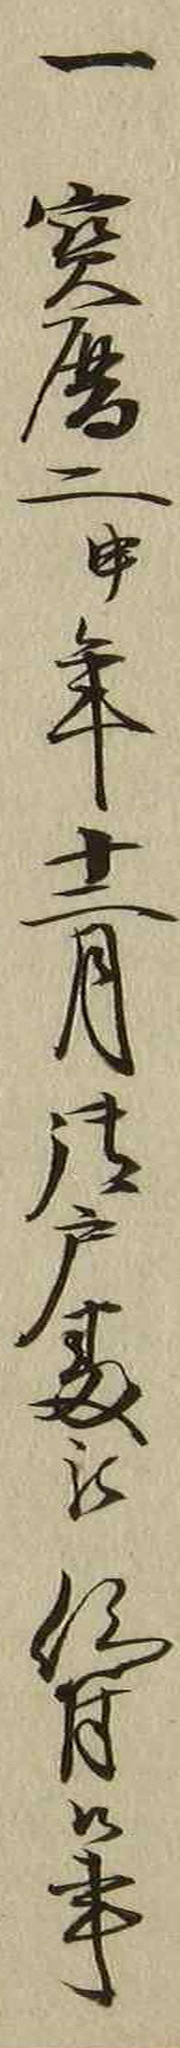一宝暦二申年十二月江戸番被仰付候事
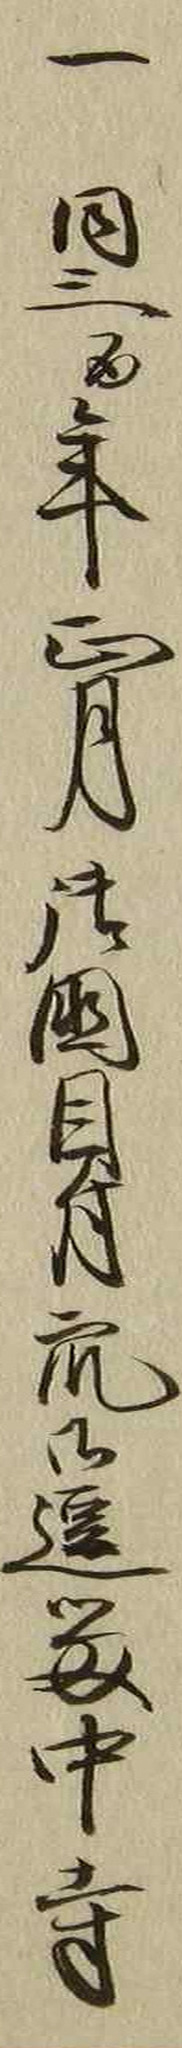一同三酉年正月御国目付衆御逗留中寺
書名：諸士系譜　巻之67　を之部1
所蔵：会津若松市立会津図書館
